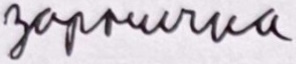зарничка
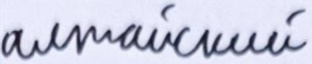алтайский
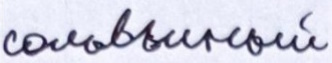соловьиный
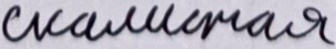скалистая
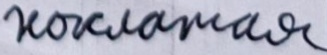хохлатая
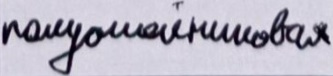полуошейниковая
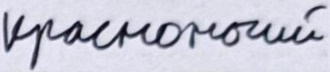красноныий
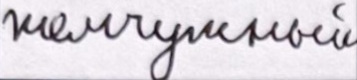жемчужный
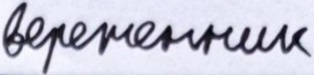веретенник
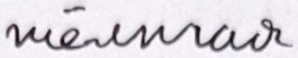жёлтая
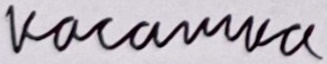касатка
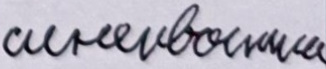синехвостка
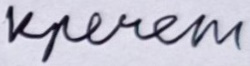кречет
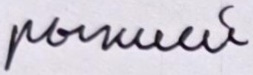рыжий
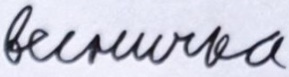весничка
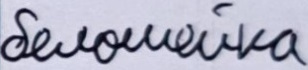белошейка
